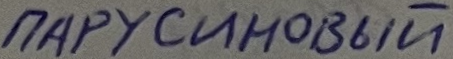парусиновый
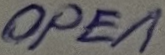орел
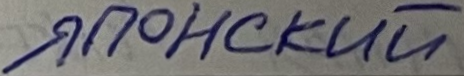японский
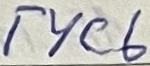гусь
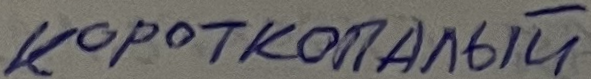короткопалый
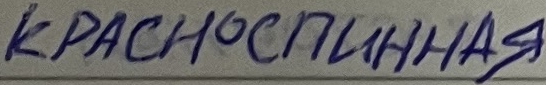красноспинная
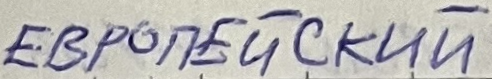европейский
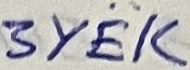зуёк
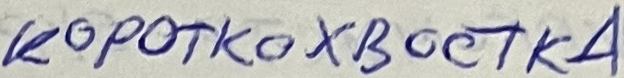короткохвостка
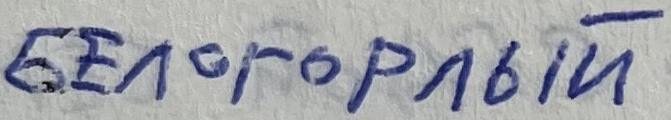белогорлый
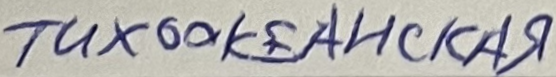тихоокеанская
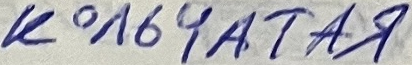кольчатая
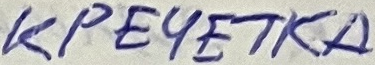кречетка
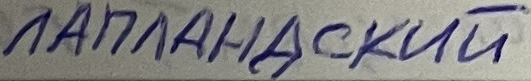лапландский
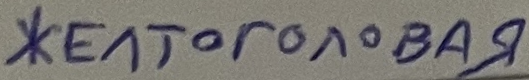желтоголовая
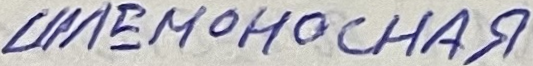шлемоносная
